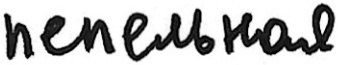пепельная
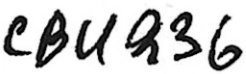свиязь
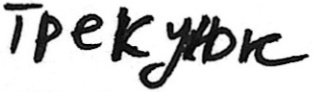трекунок
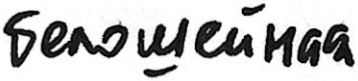белошейная
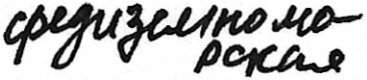средиземномо-рская
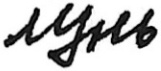лунь
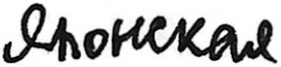японская
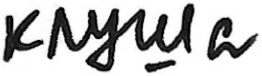клуша
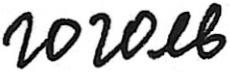гоголь
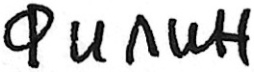филин
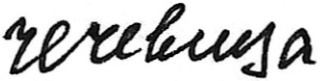чечевица
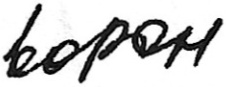ворон
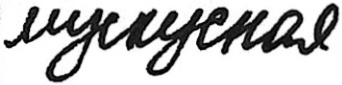мускусная
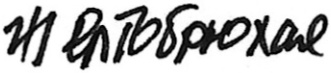желтобрюхая
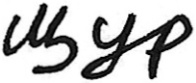щур
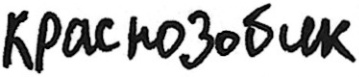краснозобик
